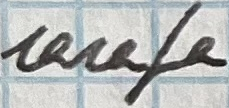гагара
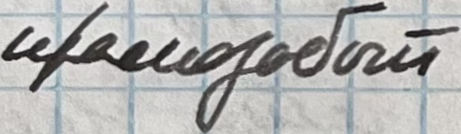краснозобый
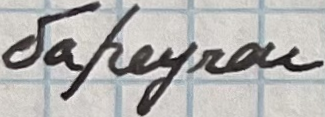барсучок
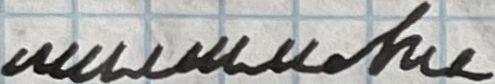шилоклювка
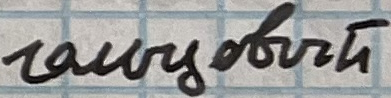гольцовый
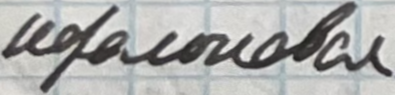корольковая
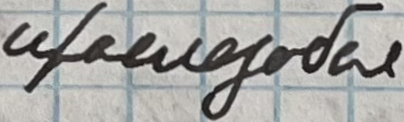краснозобая
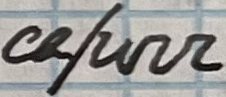сарыч
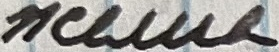желна
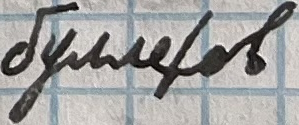буллеров
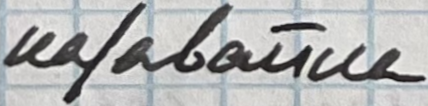каравайка
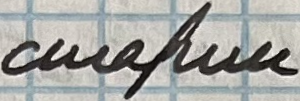старик
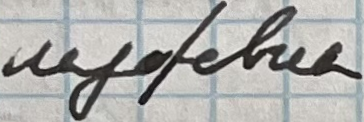лазоревка
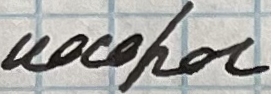носорог
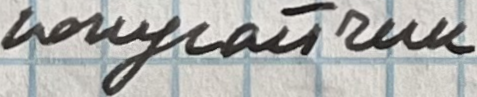попугайчик
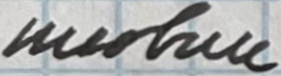тювик
